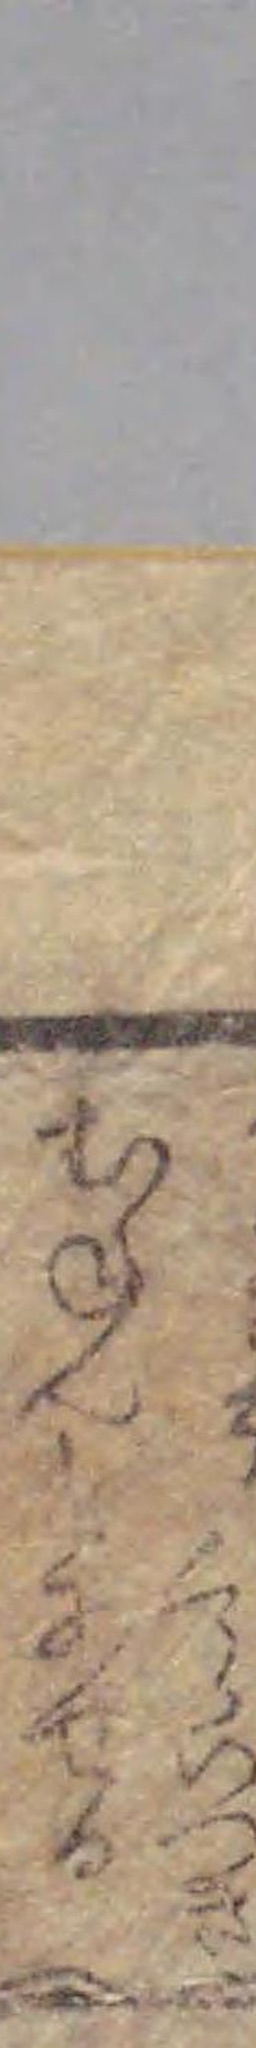むねんとあせる
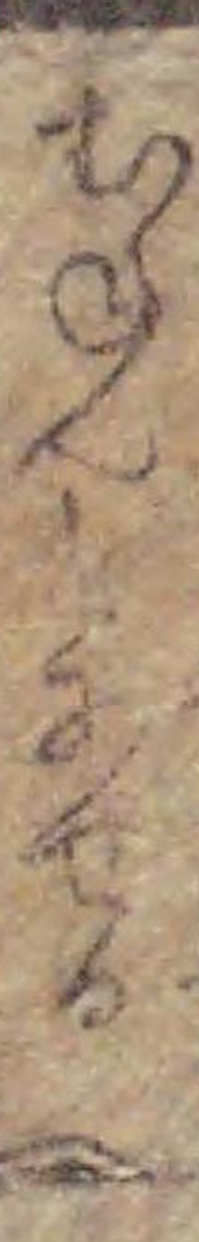むねんとあせる
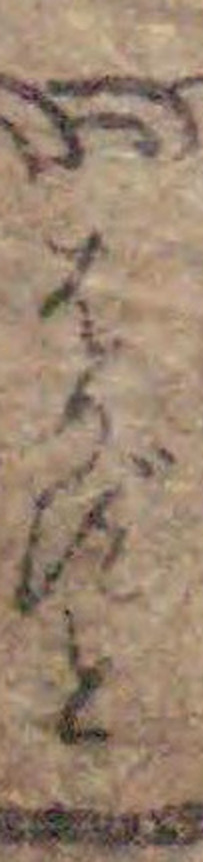はかずと
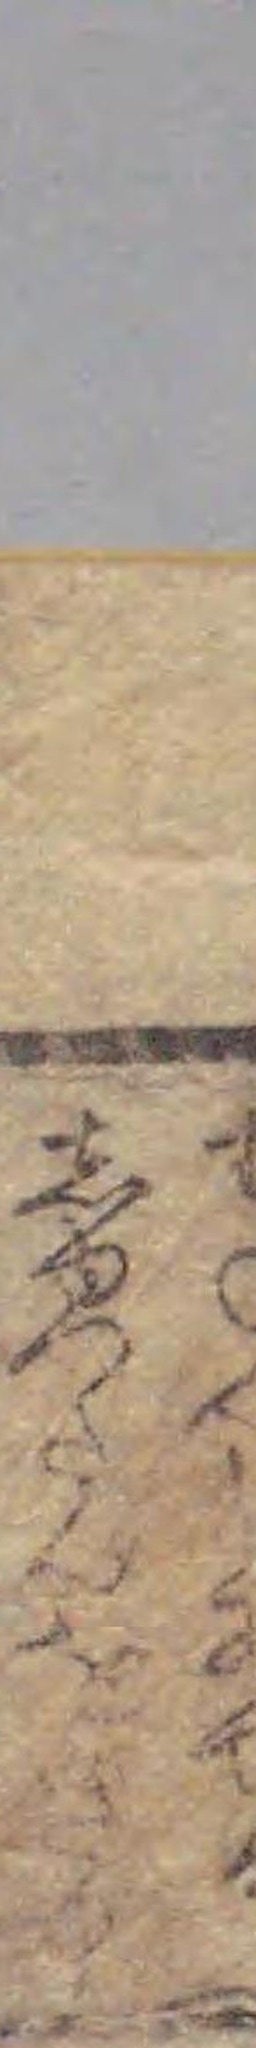しゆつたんをさか
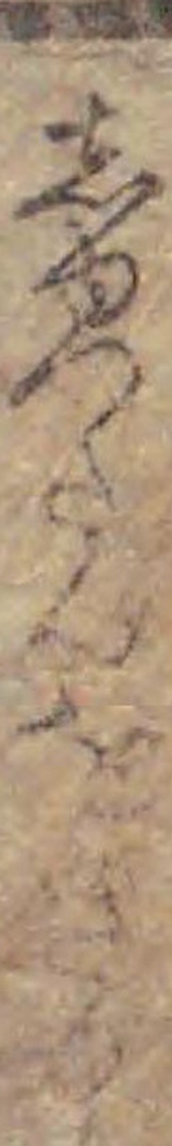しゆつたんをさか
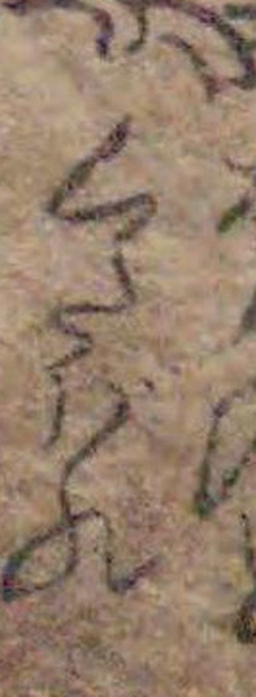くたばれ
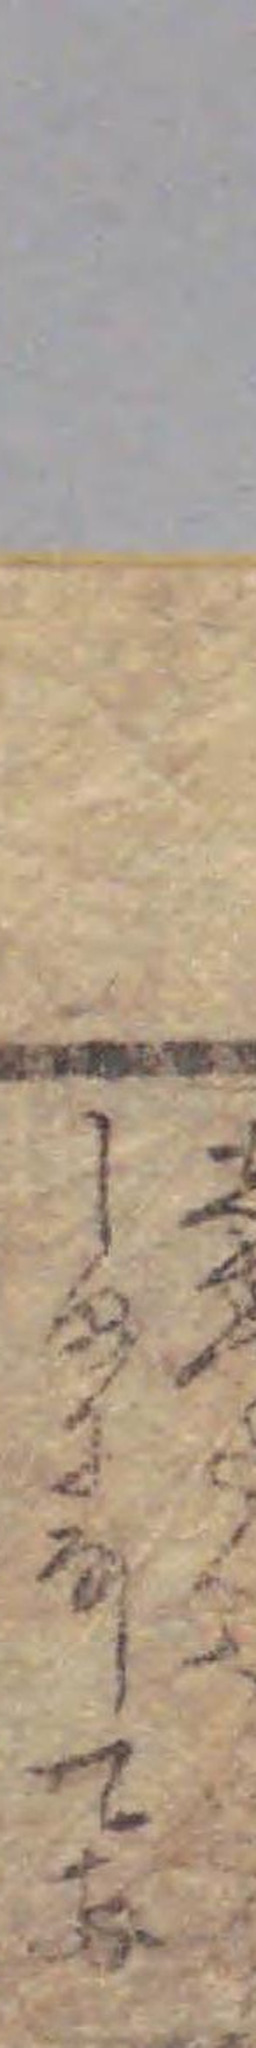しまになして両
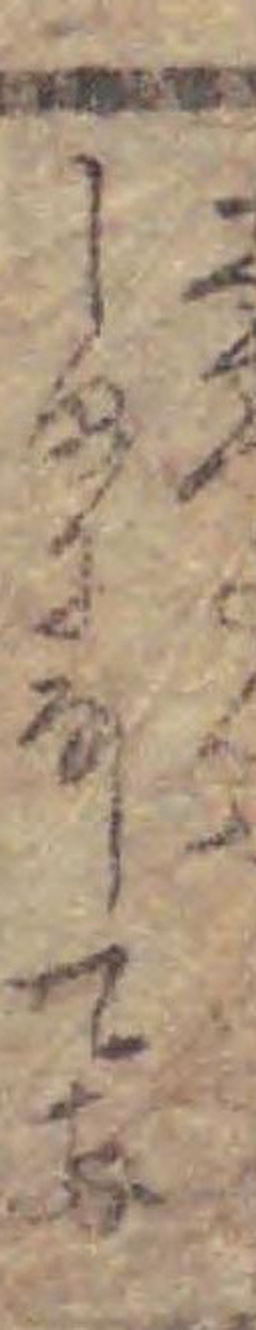しまになして両
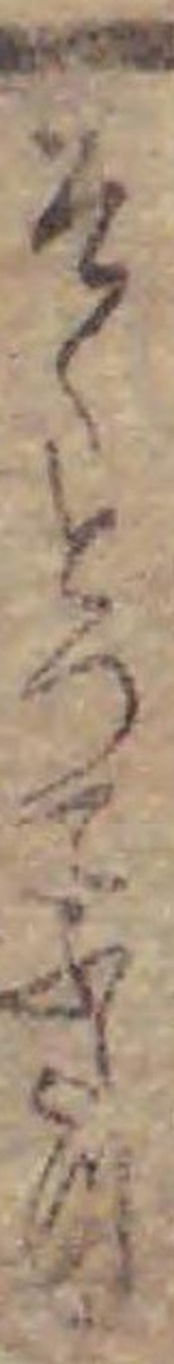そくとつてふたつ

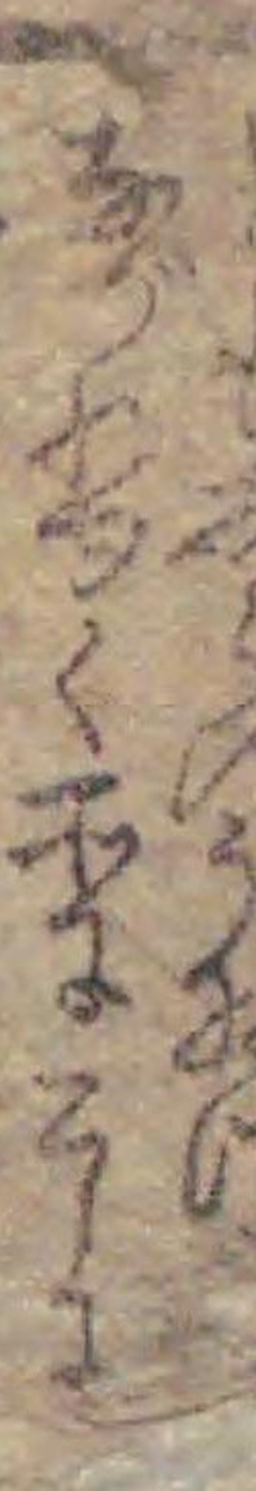ながれゆく所にこゝに
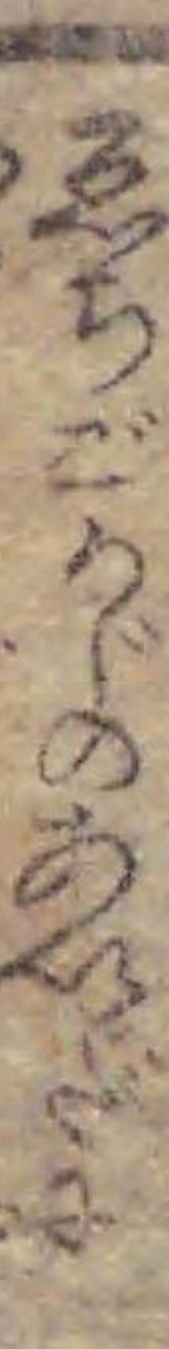ゑちごかゞのあいだに
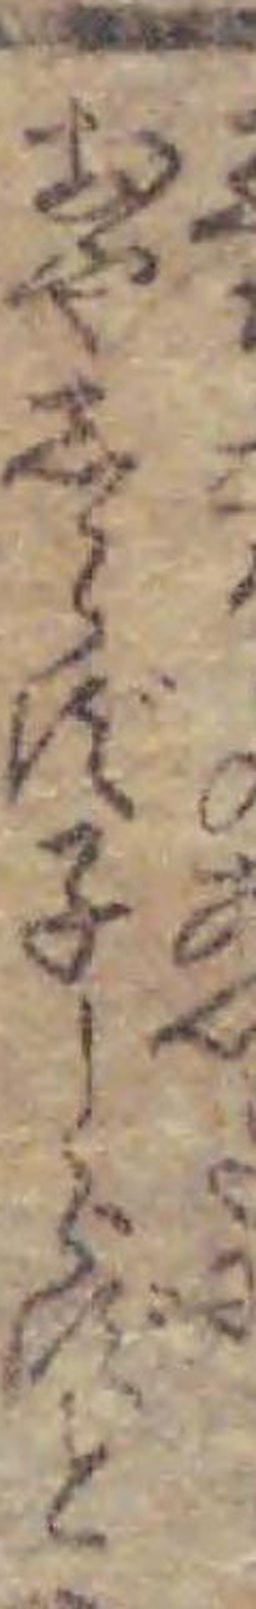おやしらず子しらずと
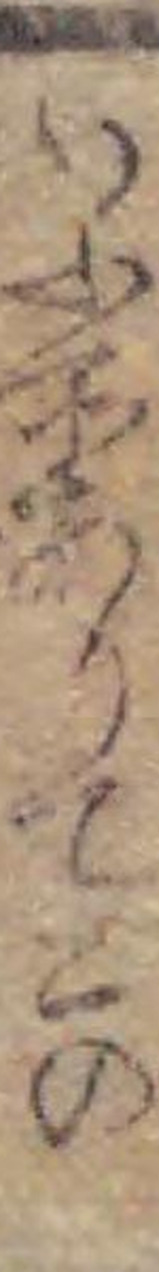いふ所ありてこの
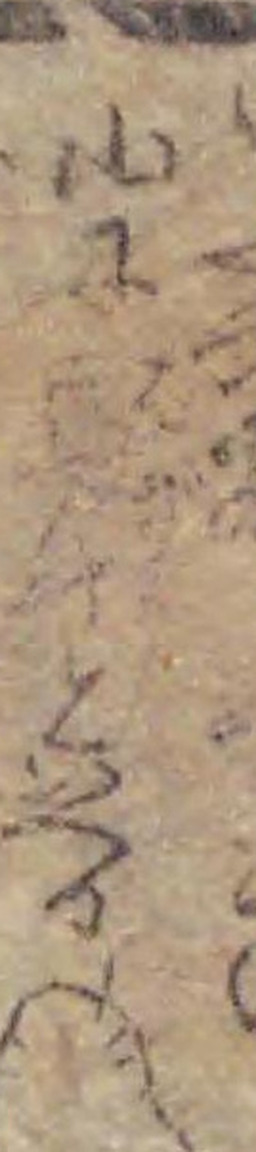山に馬斗といへる
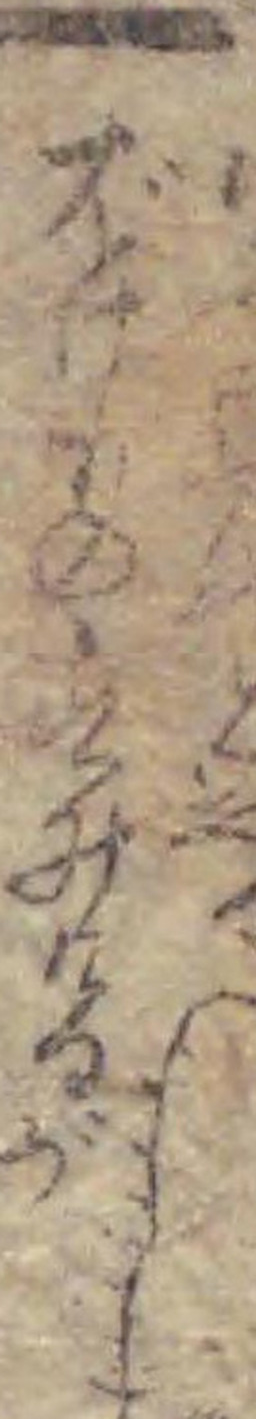ばけものすみけるが
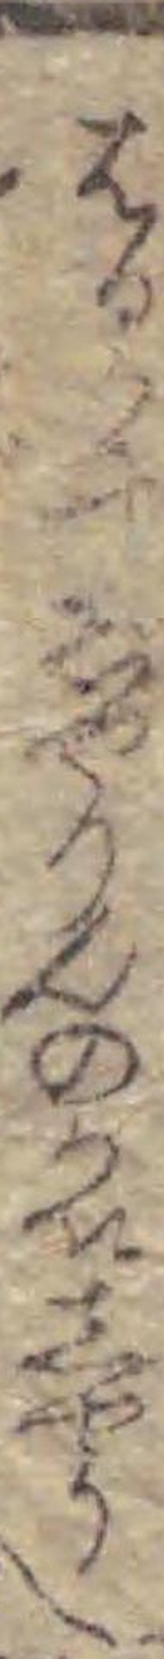はるかしやりんのかいしやう
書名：化物世界夜半嵐 : 3巻
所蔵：国立国会図書館 National Diet Library, JAPAN
